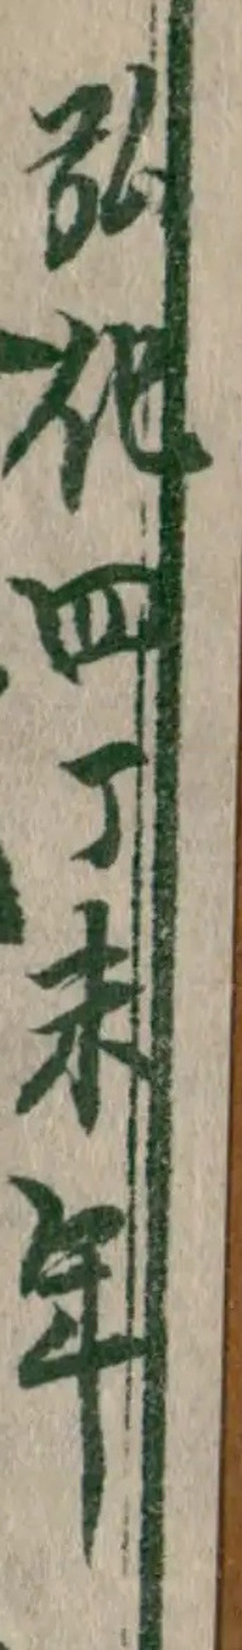弘化四丁未年
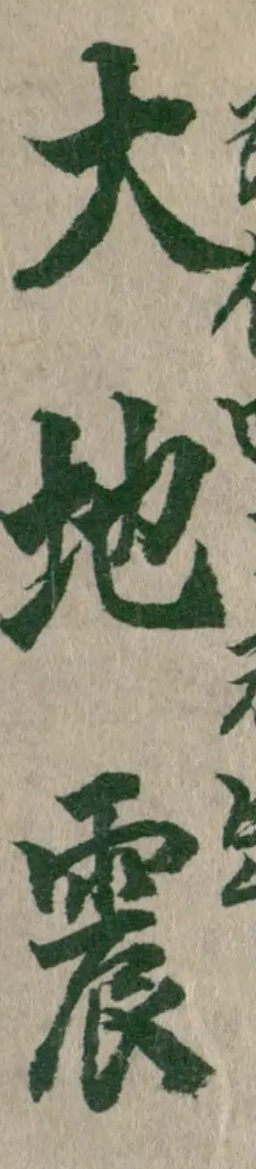大地震

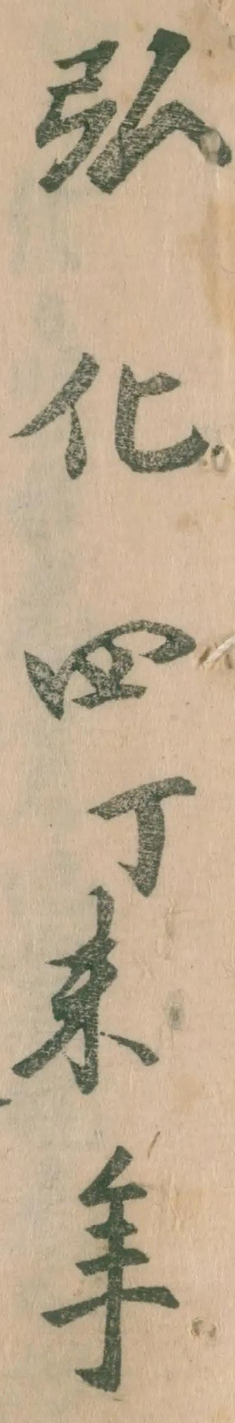弘化四丁未年

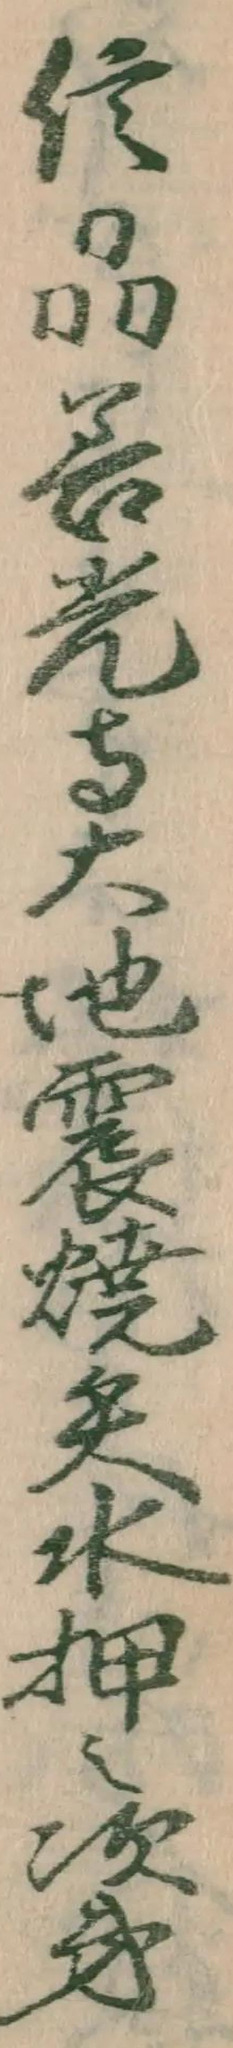信州善光寺大地震焼失水押之次第
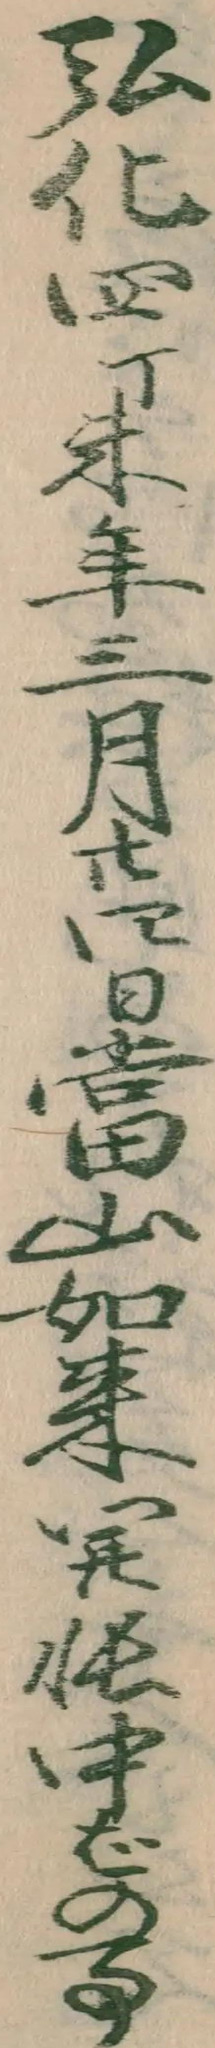弘化四丁未年三月廿四日当山如来開帳中ばの事
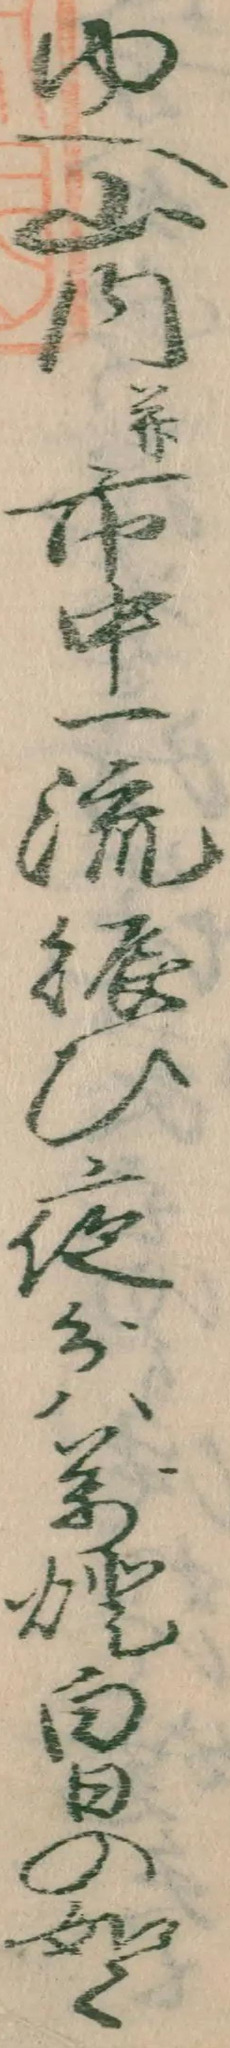ゆへ山門幷市中一流賑ひ夜分は万燈白日の如く
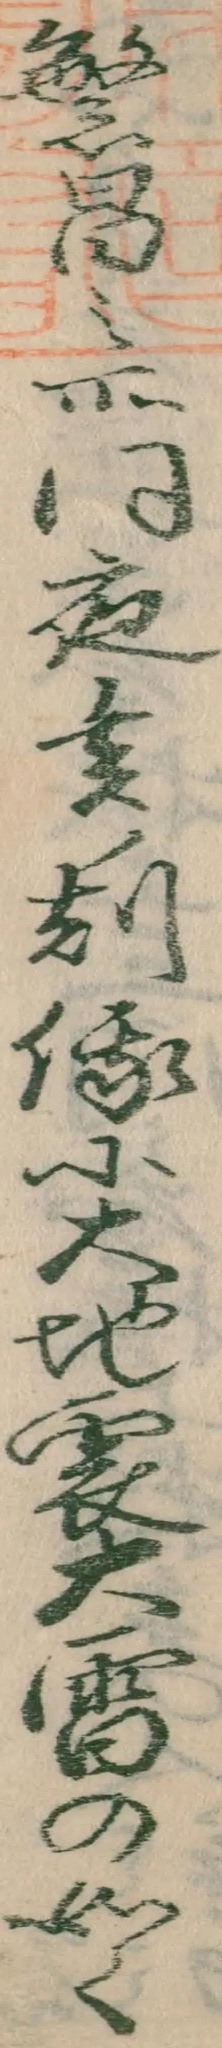繁昌之所同夜亥ノ刻俄に大地震大雷の如く
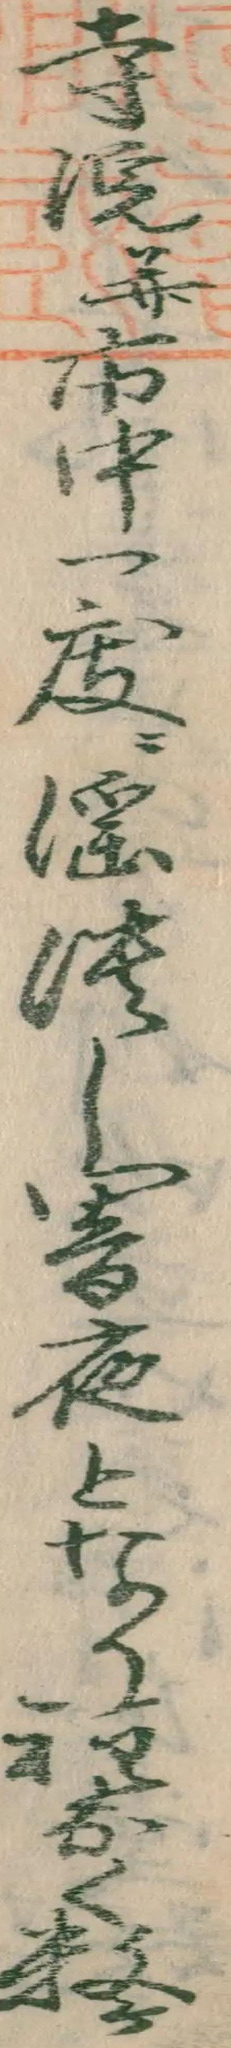寺院幷市中一度二揺潰し闇夜となり程なく数ヶ
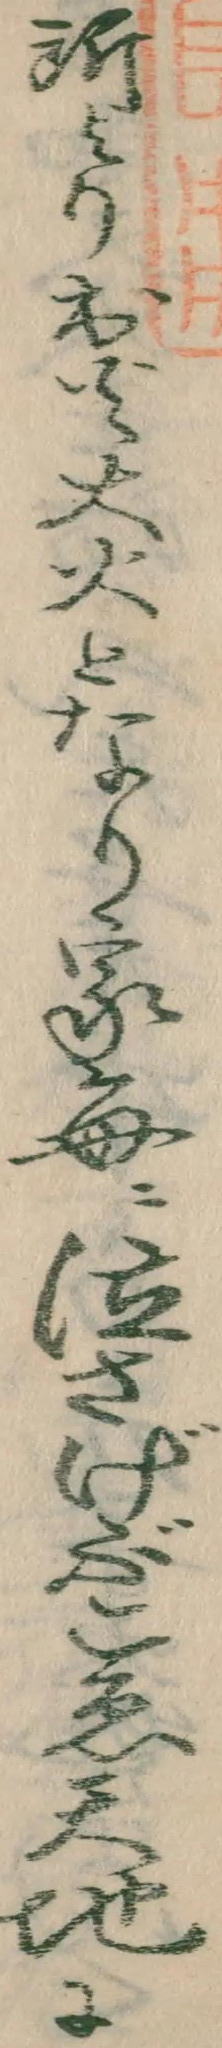所より出火大火となり家毎二泣さげぶこえ天地に
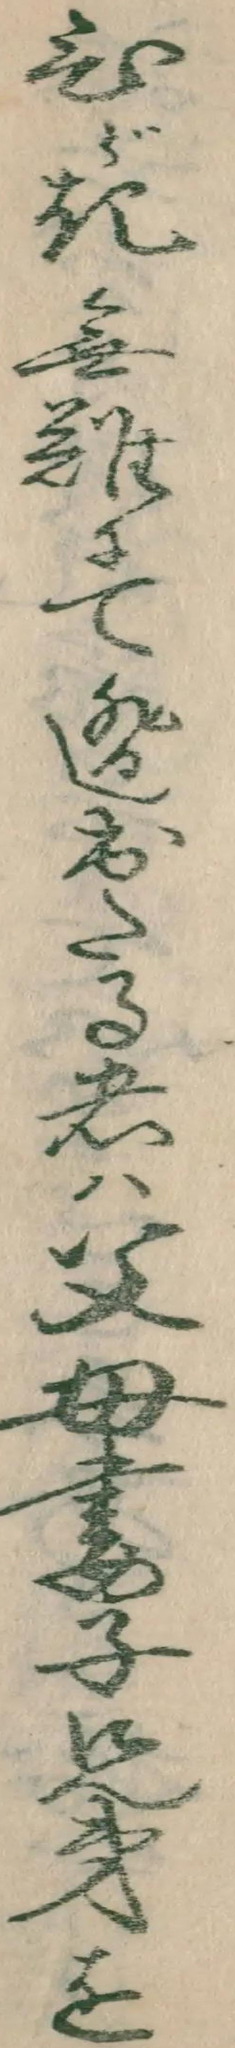ひゞき無難にて逃出たる者は父母妻子兄弟を
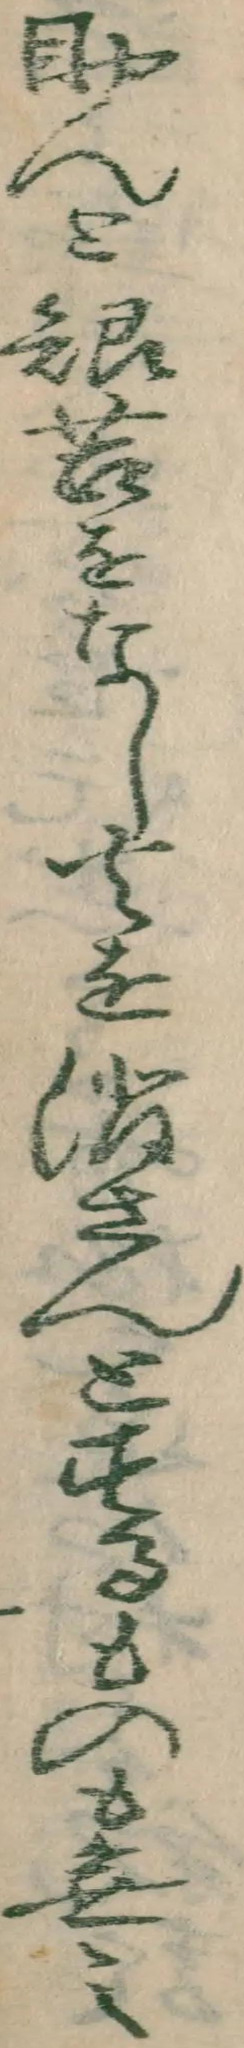助んと艱苦をなし火を消さんとするものも無之

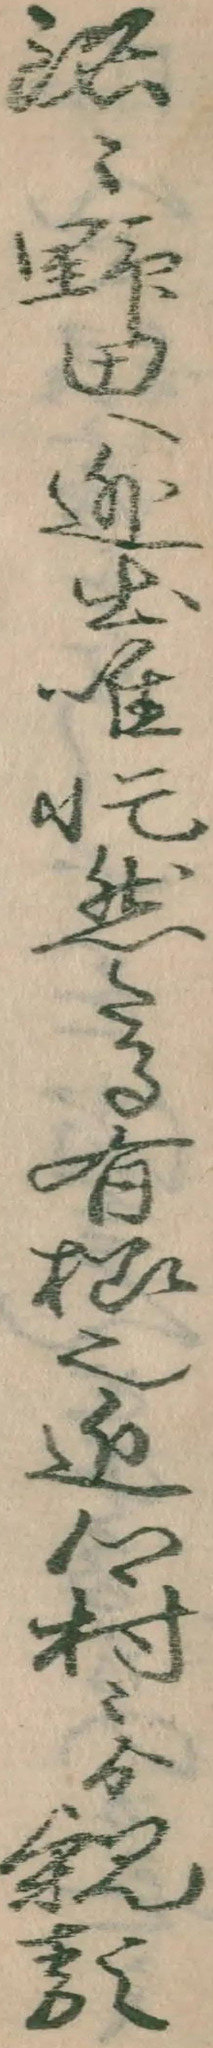銘々野田へ逃出唯茫然たる有様也近郷村々ゟ親類
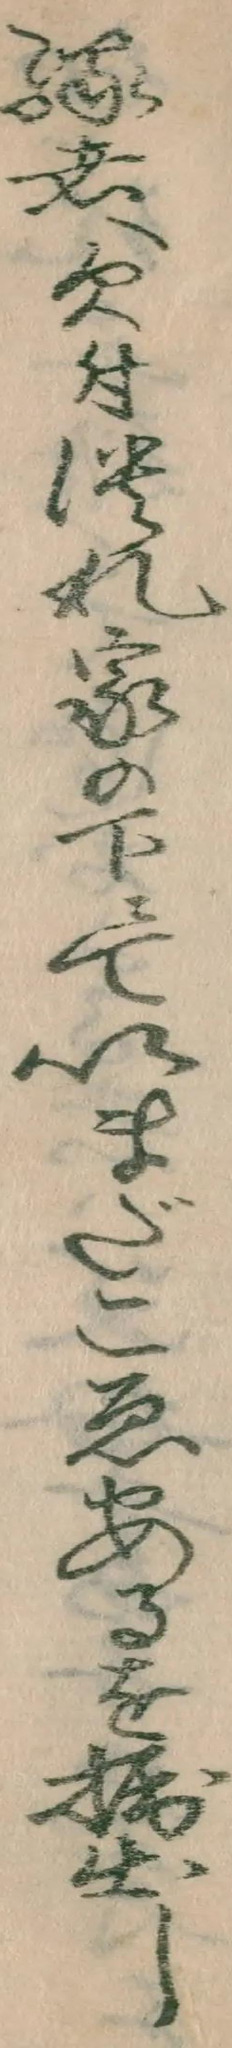縁者へ欠付潰れ家の下ニていまだこえあるを掘出し
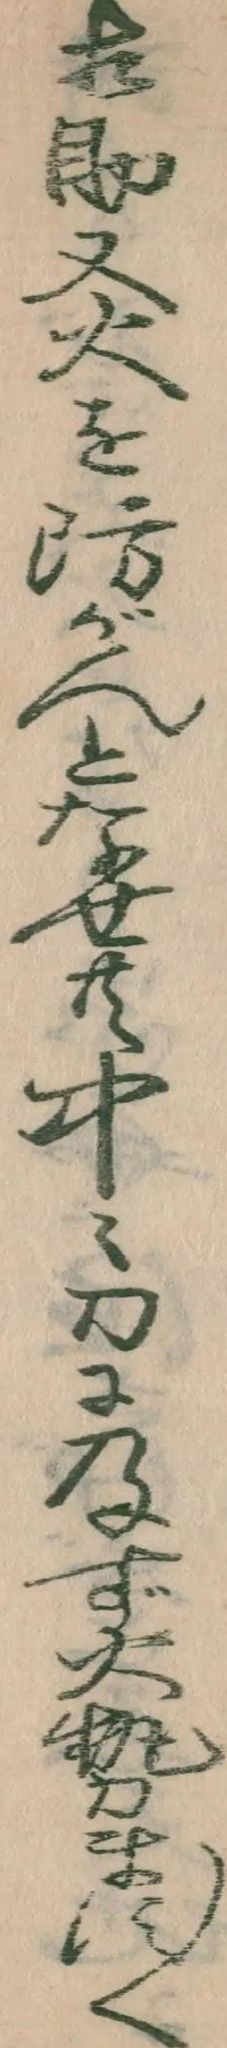相助又火を防がんとなせ共中々刀に及ず火勢ます〳〵
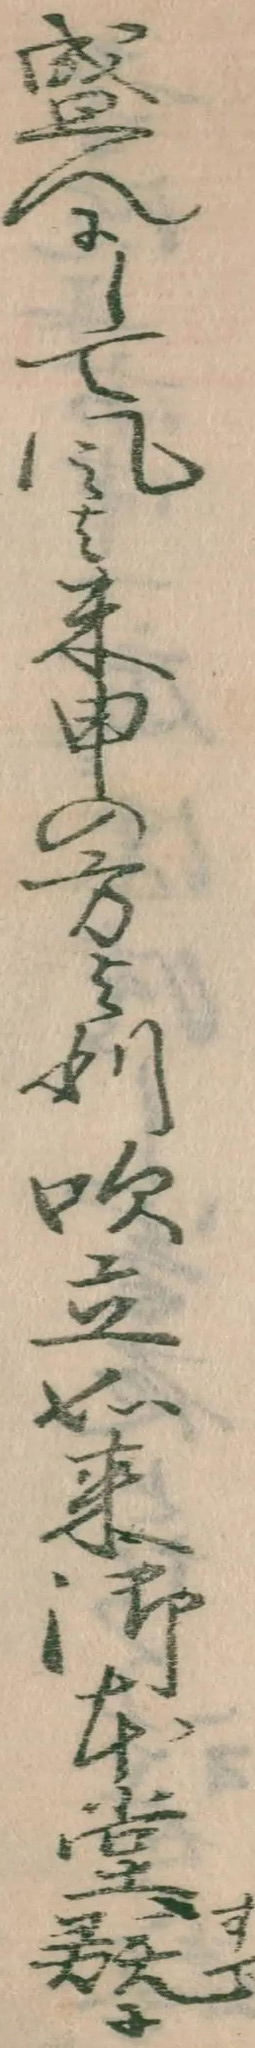盛んにして風は未申の方より吹立如来御本堂既に
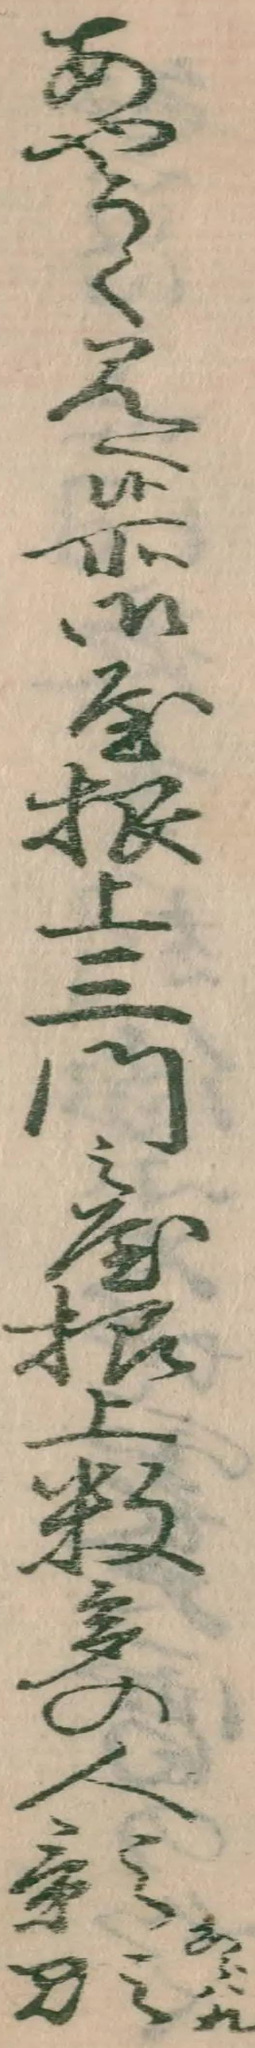あやうく見へ候所御屋根上三門之屋根上数多の人影顕
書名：大地震
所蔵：国立国会図書館 National Diet Library, JAPAN
